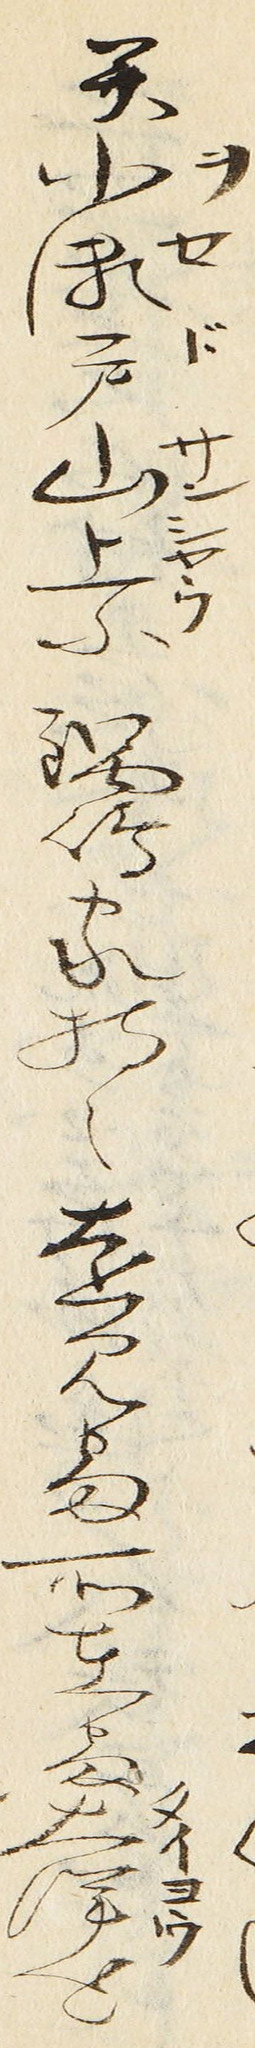幷小瀬戸山上に鍋島家持之遠見番所在番大洋を
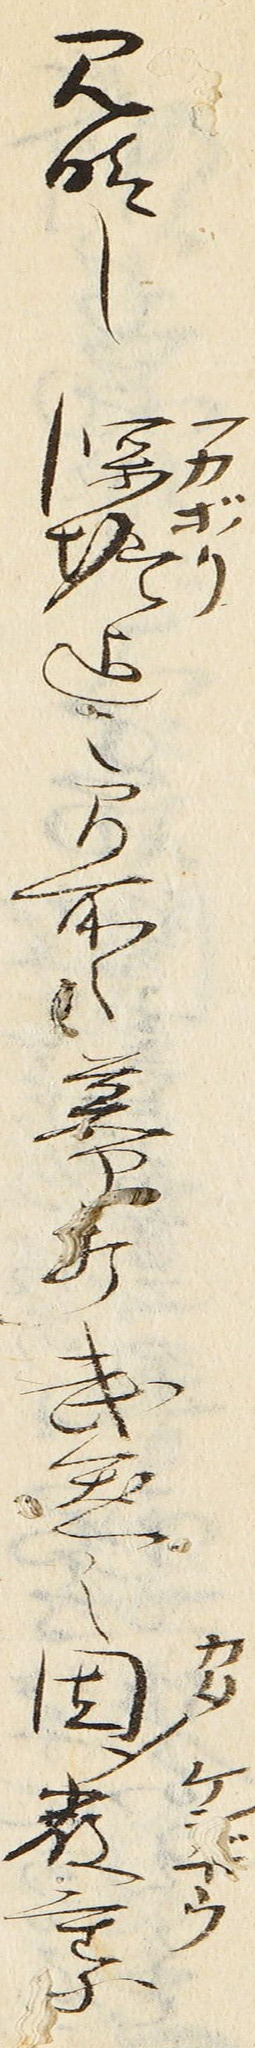見晴し深堀迄之間所々幕打武器之固め厳重に
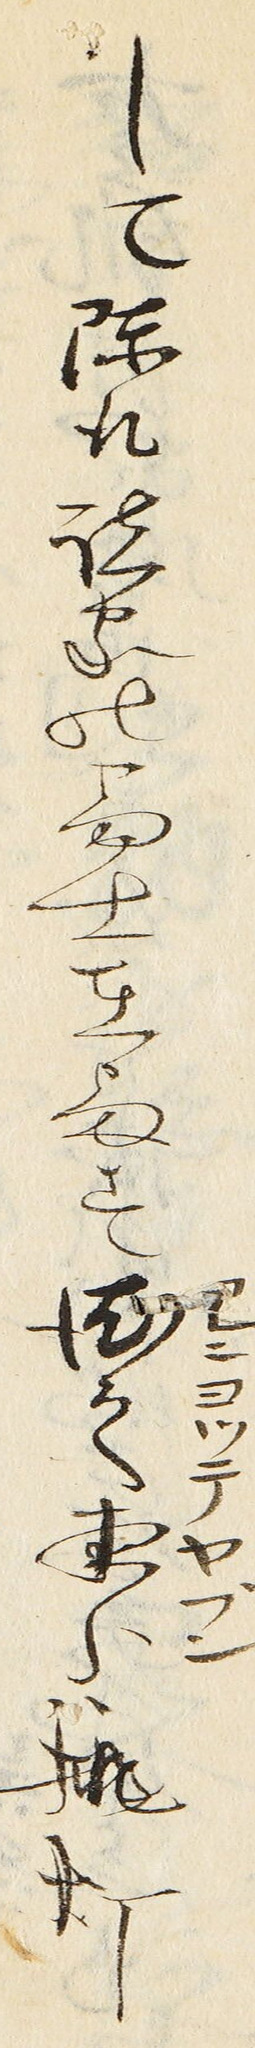して陣取諸家の番士在番す依之夜分は挑灯
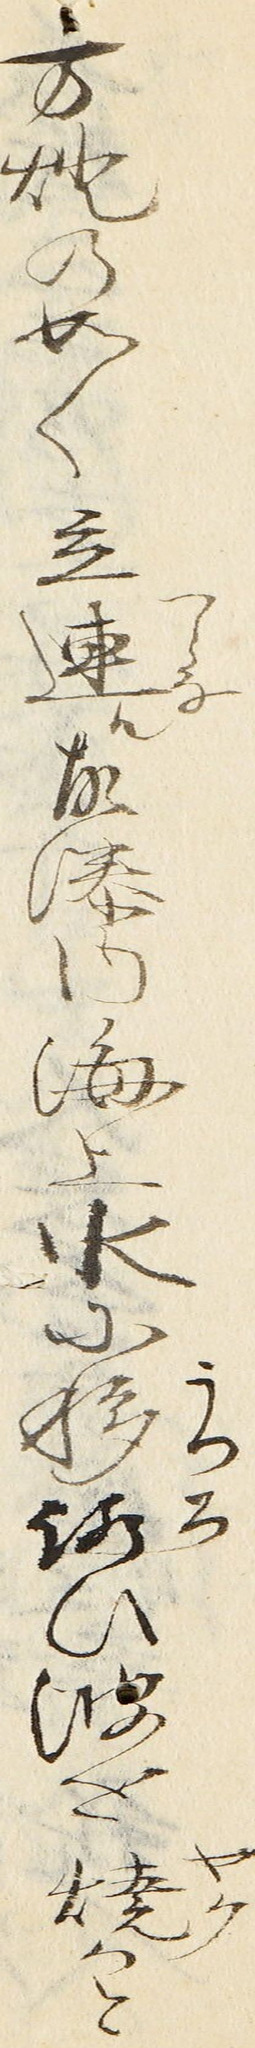方灯の如く立連る故湊内海上水に移路ひ波を焼かと
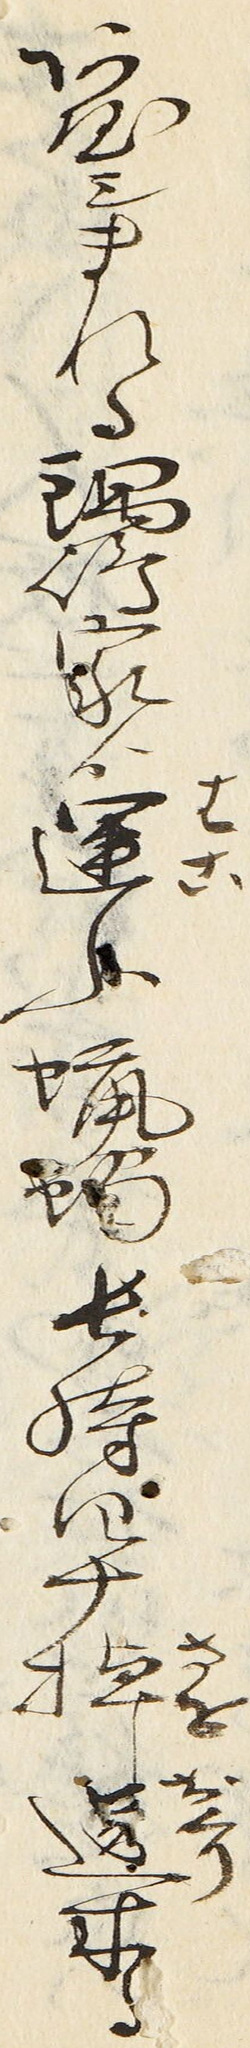あやしまれる鍋島家より運ふ蝋燭長持四十棹送来る
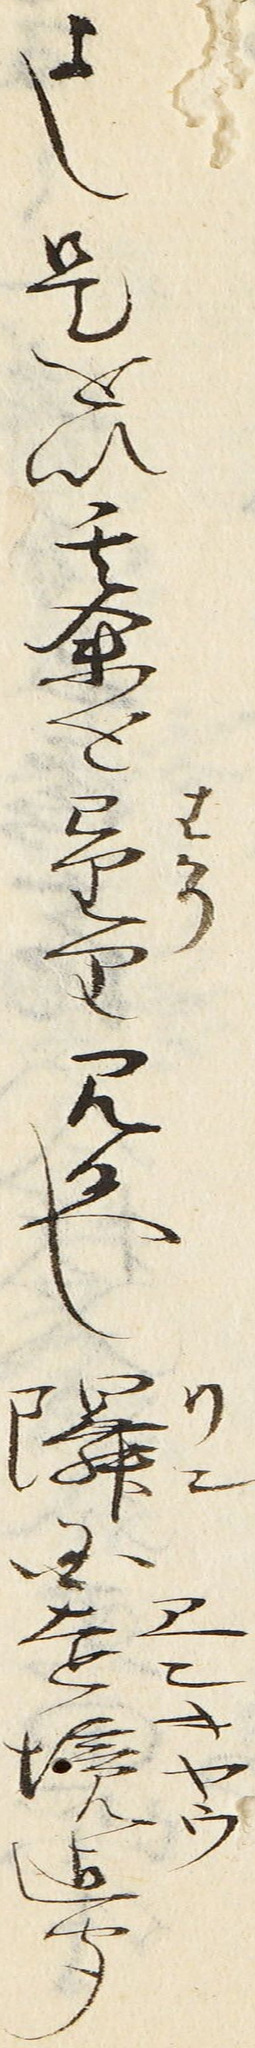よし是を以其余を量り見るへし隣国遠境迄聞
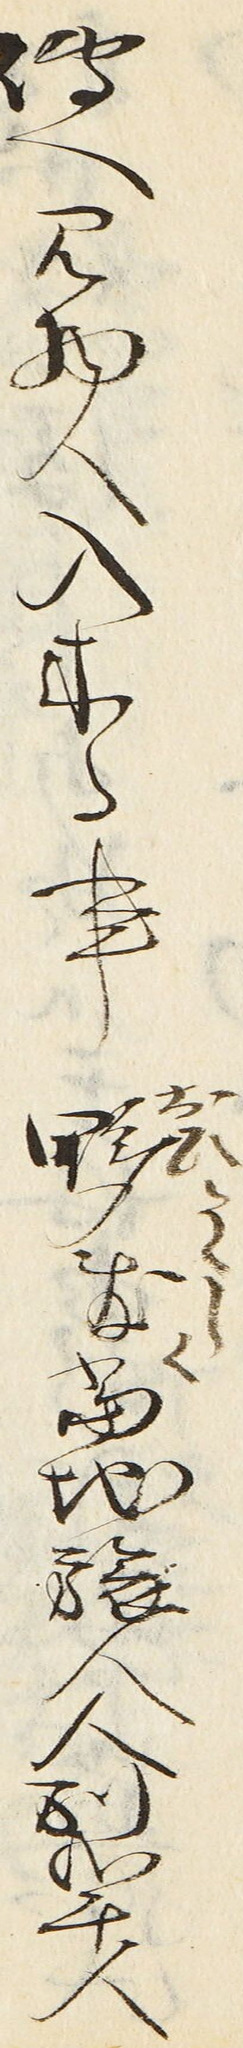伝へ見物人入来る事夥敷当地旅人人別弐千人
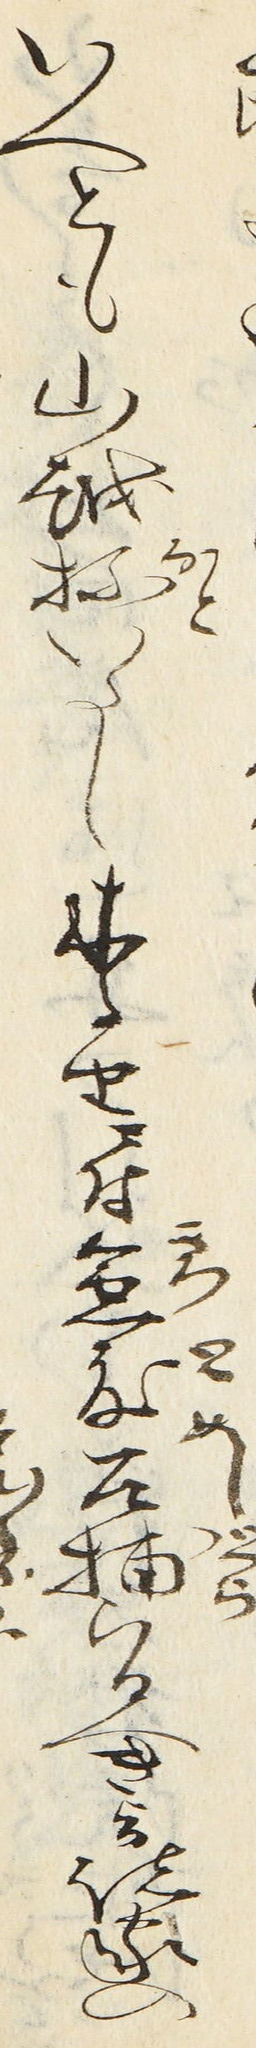いへとも山越抔いたし来る由に付急度召捕らるへき旨諸家の
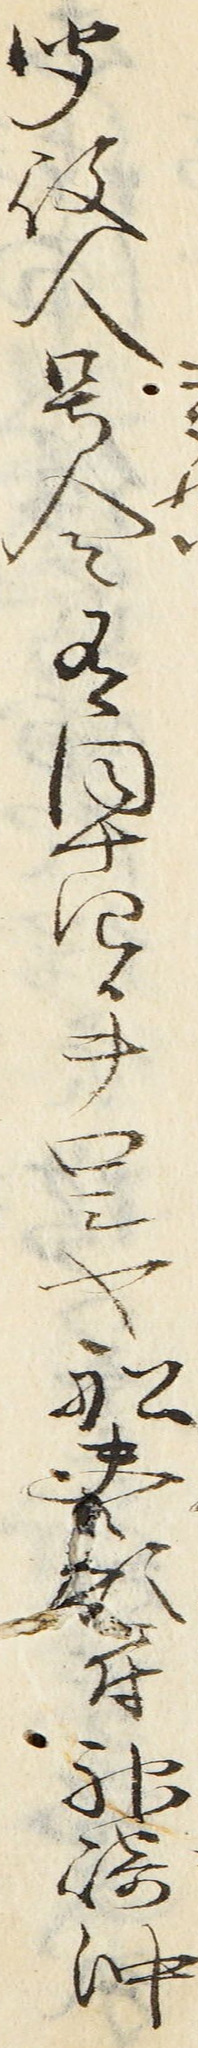聞役人号令有同十四日ヲロシヤ船夫々願に付神崎沖
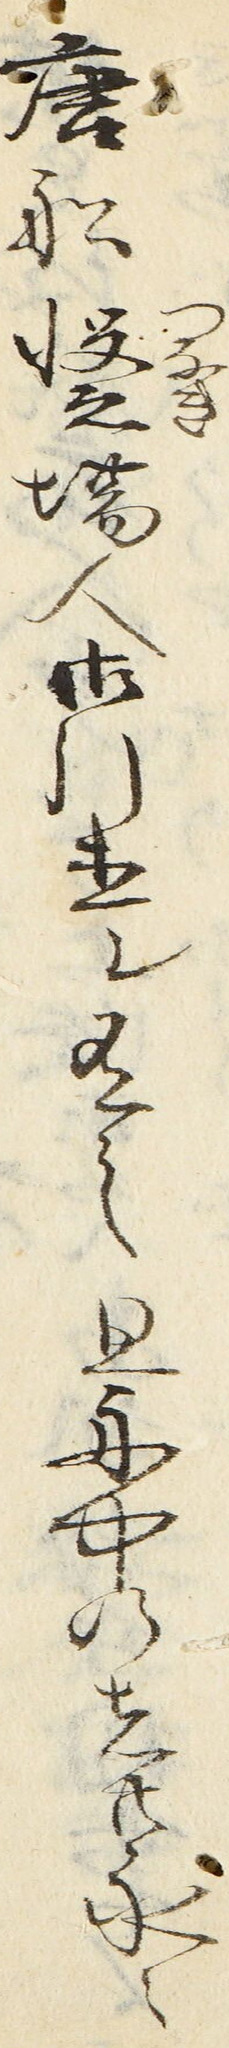唐船繋場人御引直し有之且舟中の者共永々

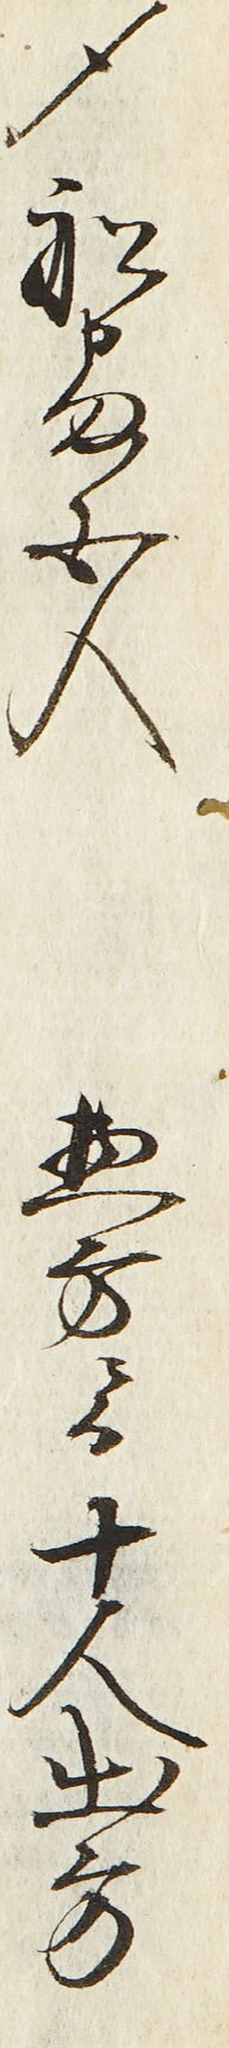〆船番五人惣方にて拾人出方
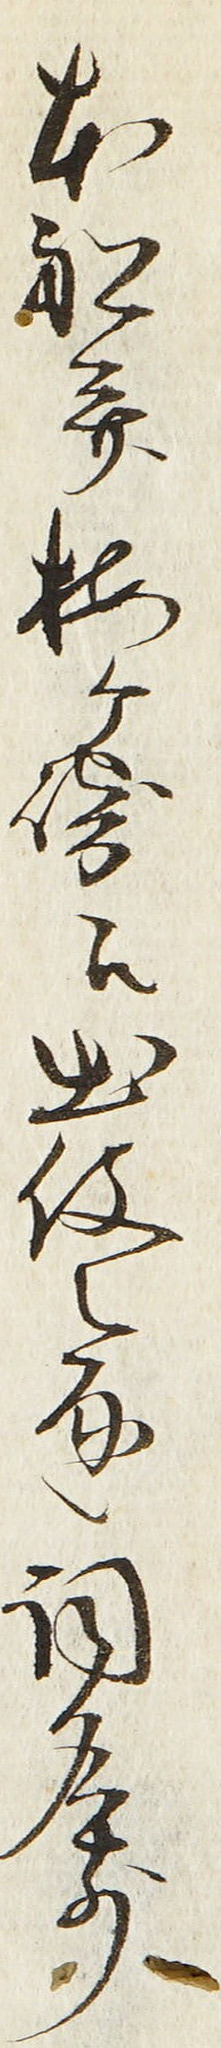本船幷梅ヶ崎え出役し通詞名前
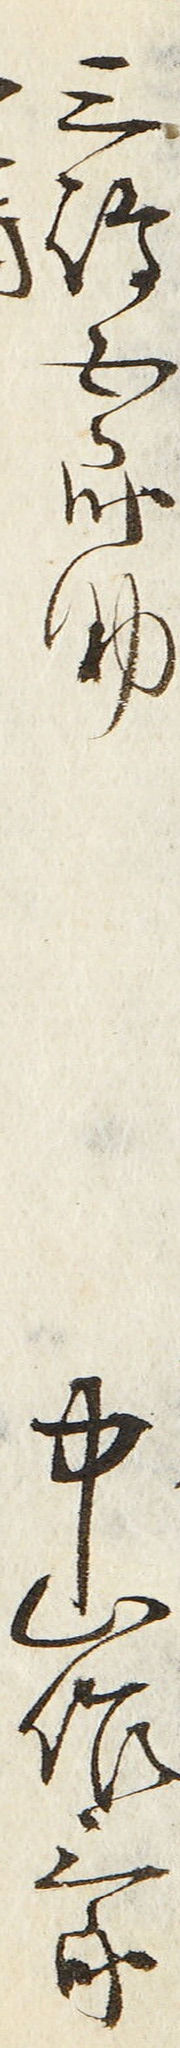三島五郎助中山作三郎
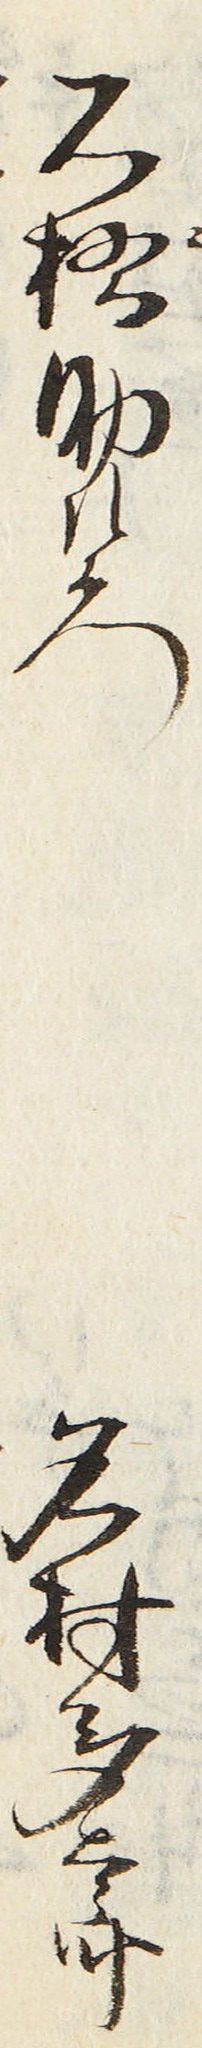石橋助左衛門名村多太郎
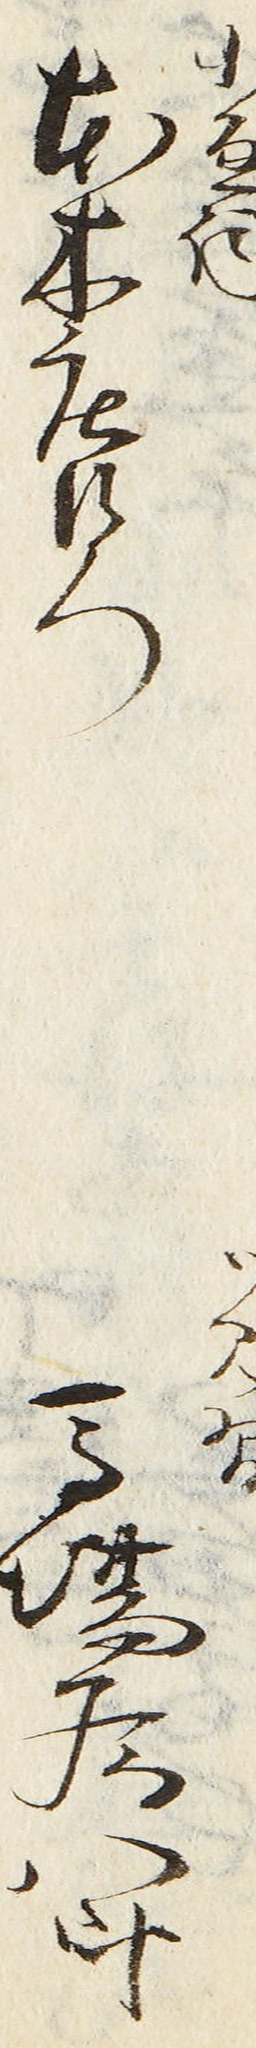本木庄左衛門馬場為八郎
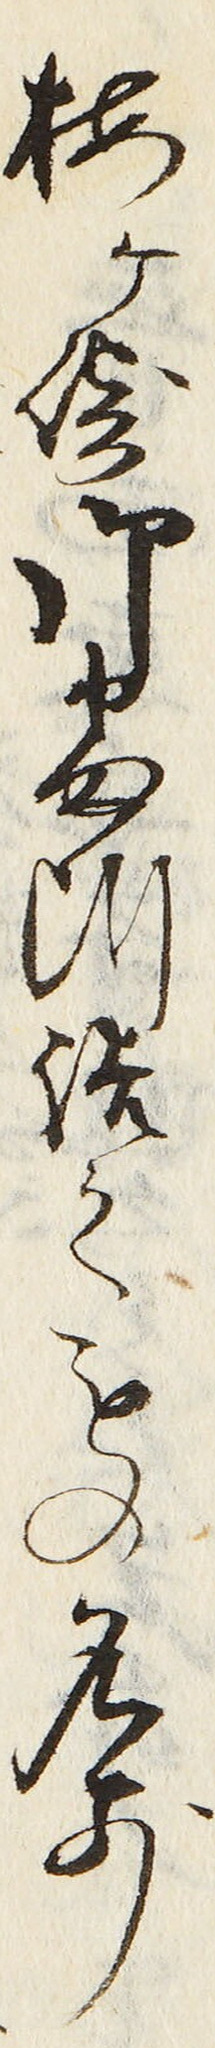梅ヶ崎御番所詰之もの名前
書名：魯西亜国舟渡来始末并日本流漂人異国遍歴之話（西洋欧羅巴州之内一）
